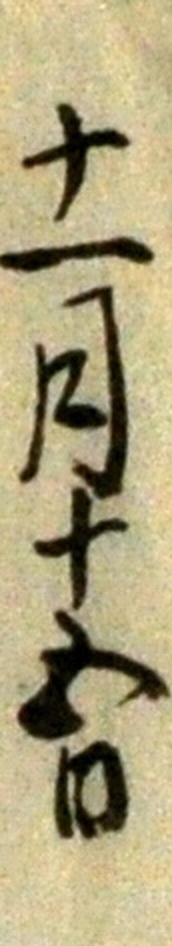十一月十五日
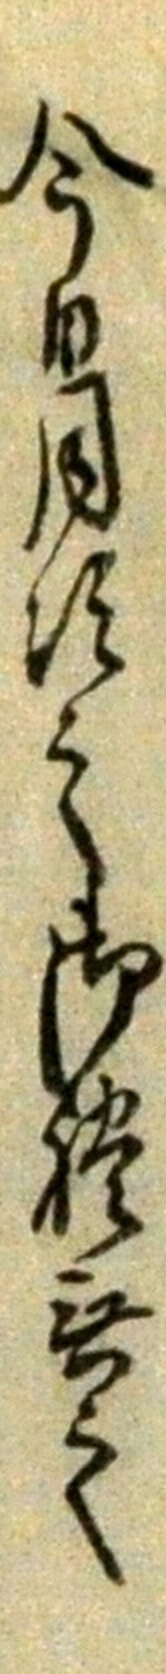一今日月次之御礼無之
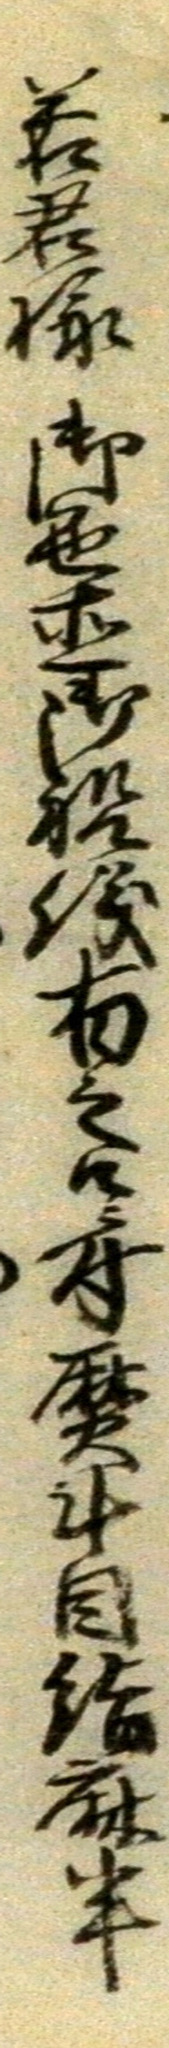若君様御色直御祝儀有之候ニ付熨斗目絹麻半
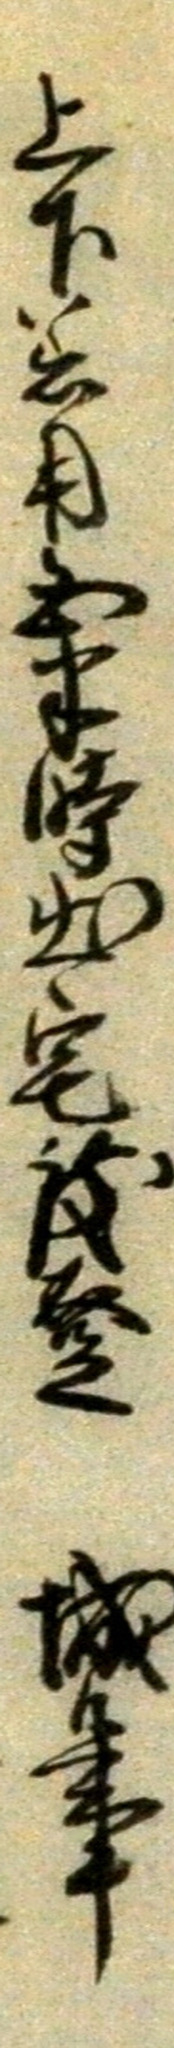上下着用五半時出宅致登城候事
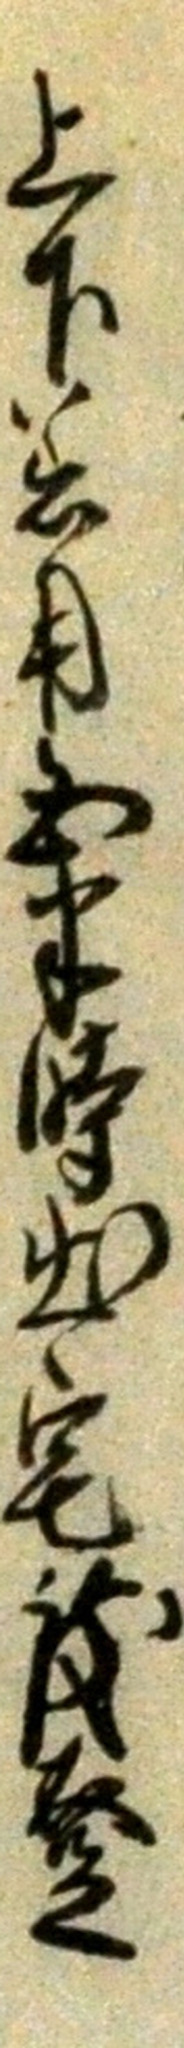上下着用五半時出宅致登城候事
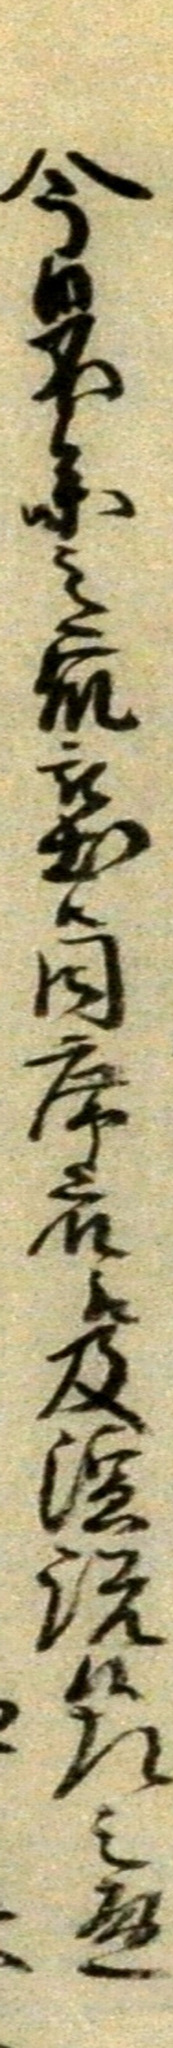一今日不参之衆被出候同席衆え及演説候左之通
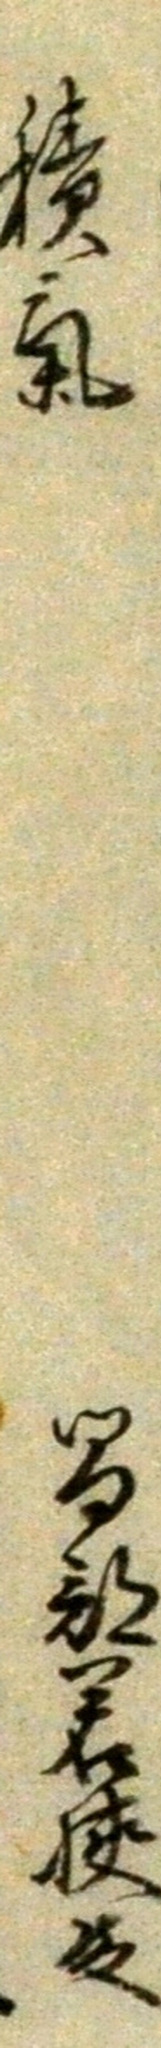積気間部若狭殿
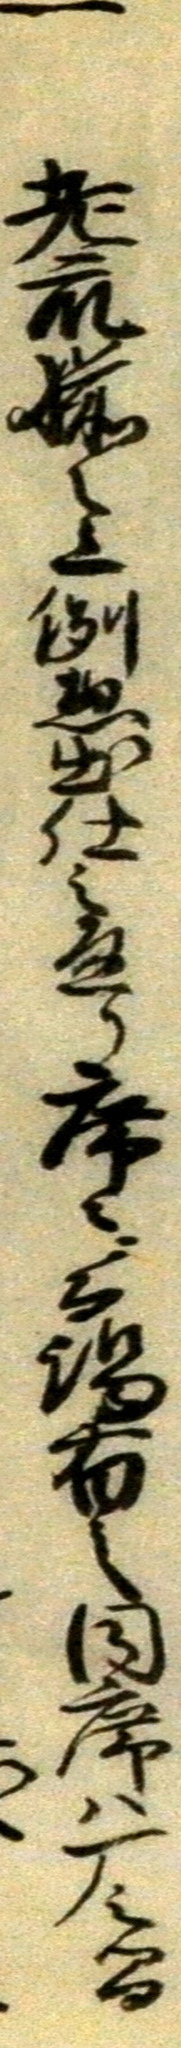老衆揃之上例惣出仕之通り席々ニ而謁有之同席ハ雁之間
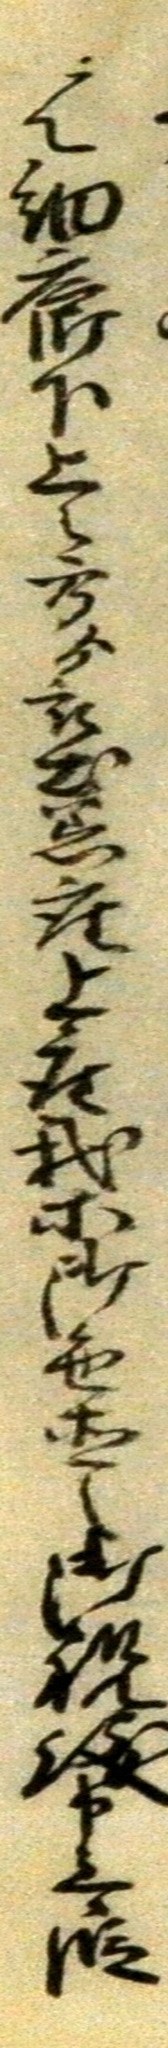ニて細廊下上之方ゟ被出着座上座我等御色直之御祝儀申上候段
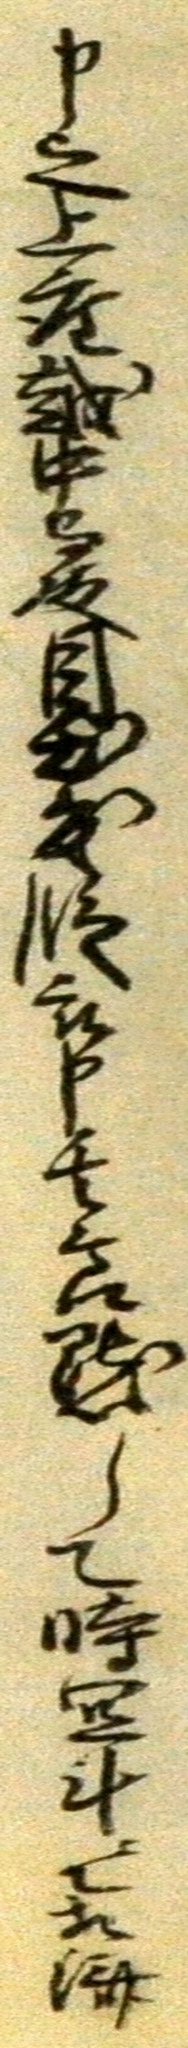申上之上座越中守殿目出度段被申其節黙して時宜計ニて相済
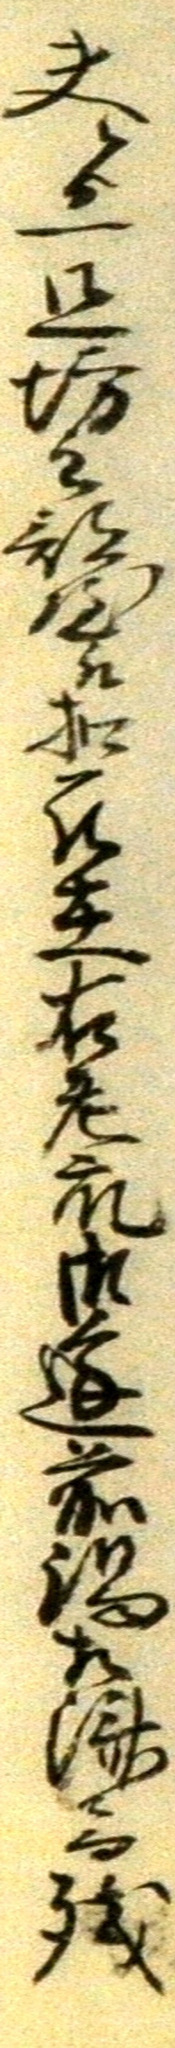夫レゟ一旦坊主部屋え扣罷在右老衆御逢前謁相済ニ而残

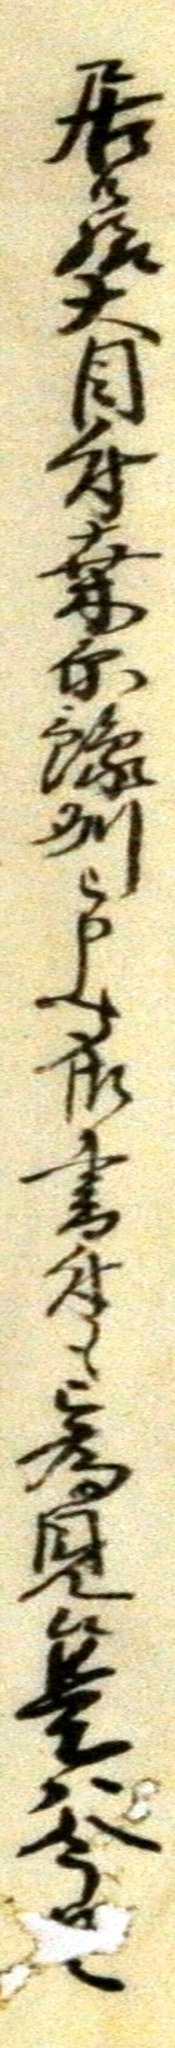居候様大目付桑原豫州被申聞御書付も被為見候是ハ今
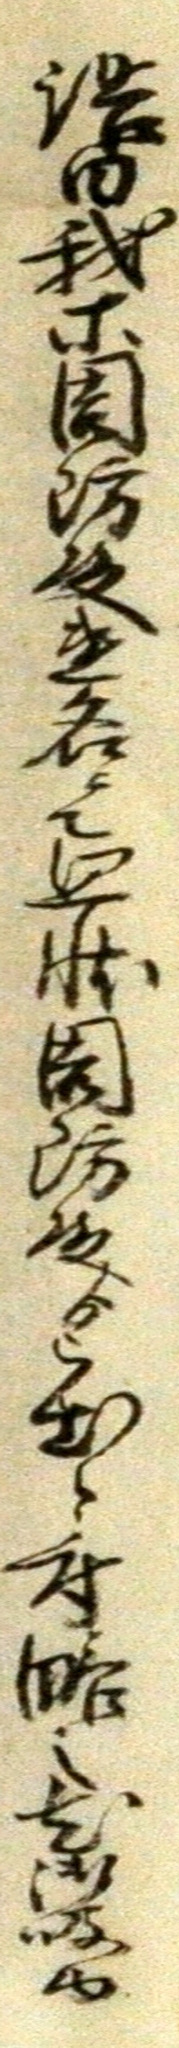詰日我等周防殿連名ニて廻状周防殿ゟ被出候付略之尤御吸物
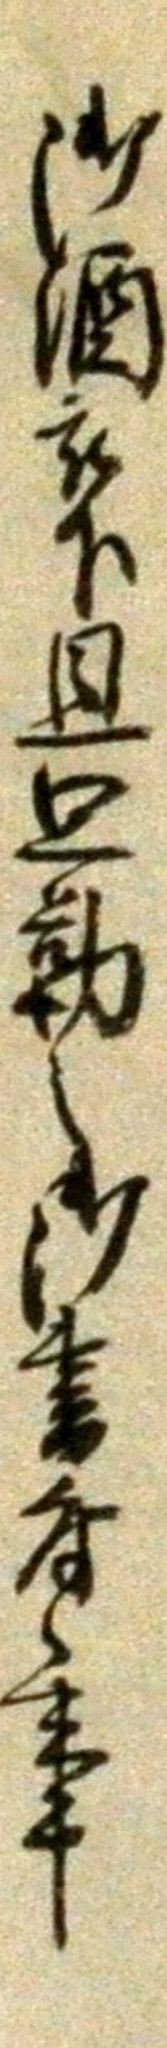御酒被下且廻勤之御書付候事
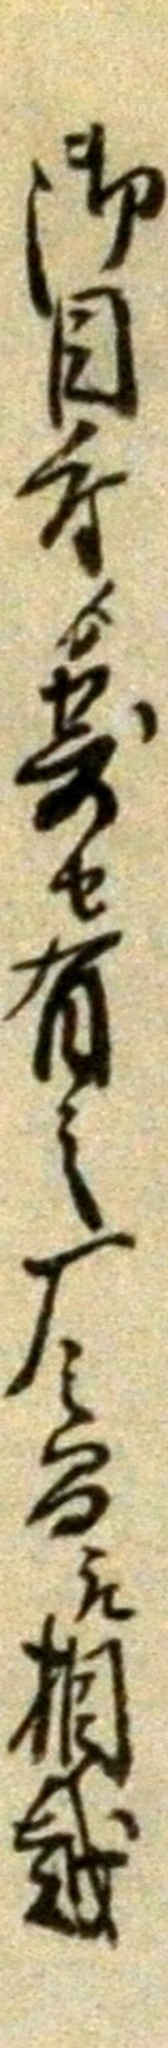一御目付ゟ寄セ有之雁之間え相越
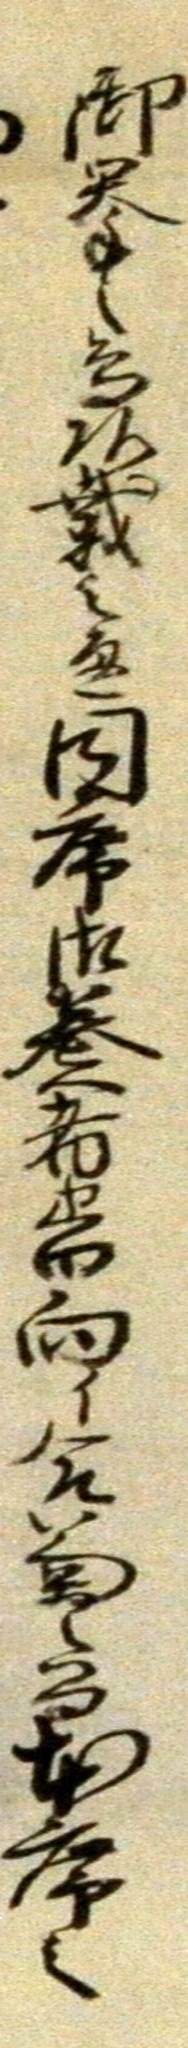御挙之鳥頂戴之通同席御奏者番向イ合菊之間本席之
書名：若君様御色直御祝儀ノ節ノ留
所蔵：伊那市立高遠町図書館・合同会社AMANE
